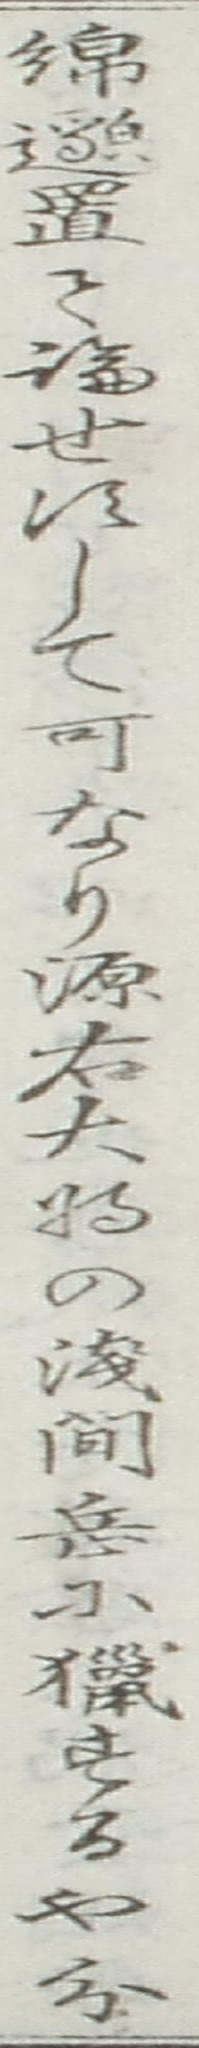綿邈置て論せずして可なり源右大将の浅間岳に猟するや分

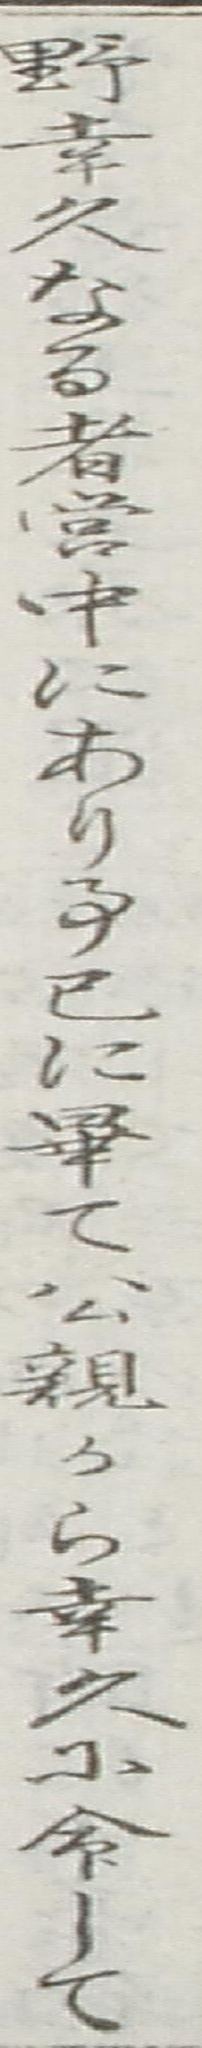野幸久なる者営中にあり事已に畢て公親から幸久に命して
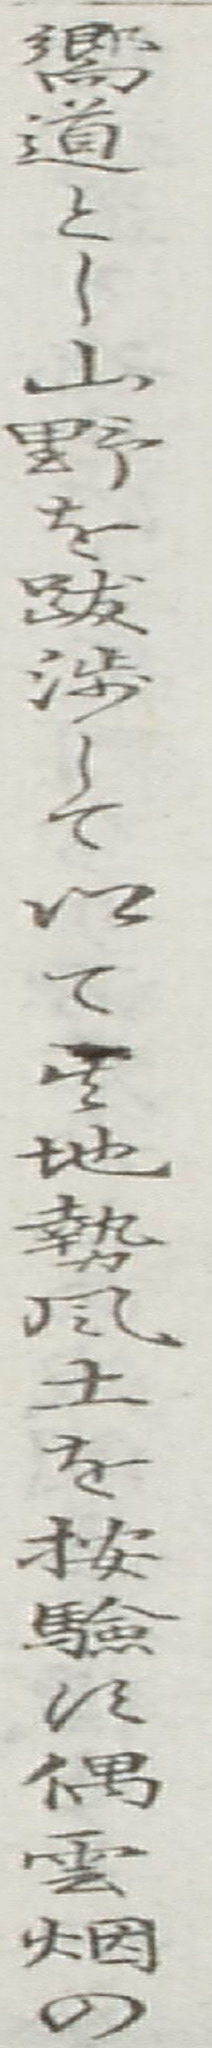嚮道とし山野を跋渉して以て其地勢風土を按験す偶雲煙の
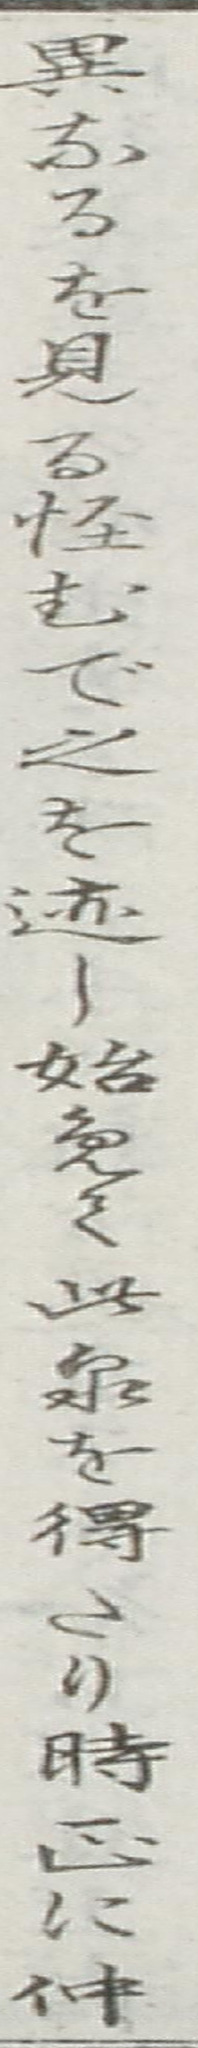異なるを見る怪むで之を迹し始めて此泉を得たり時正に仲
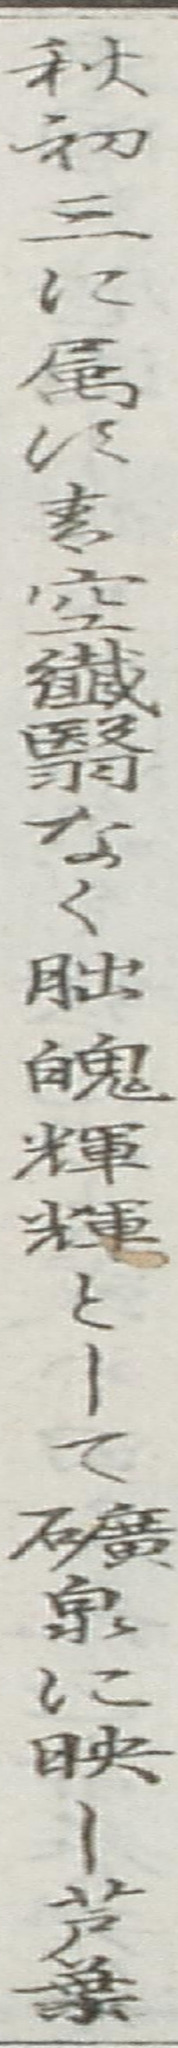秋初三に属し青空繊翳なく朏魄輝輝として鉱泉に映し芦葉
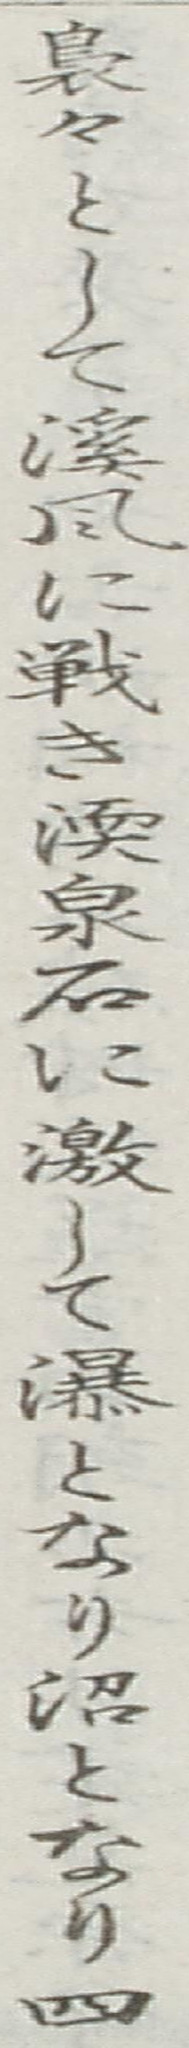裊々として渓風に戦き愞泉石に激して瀑となり沼となり四
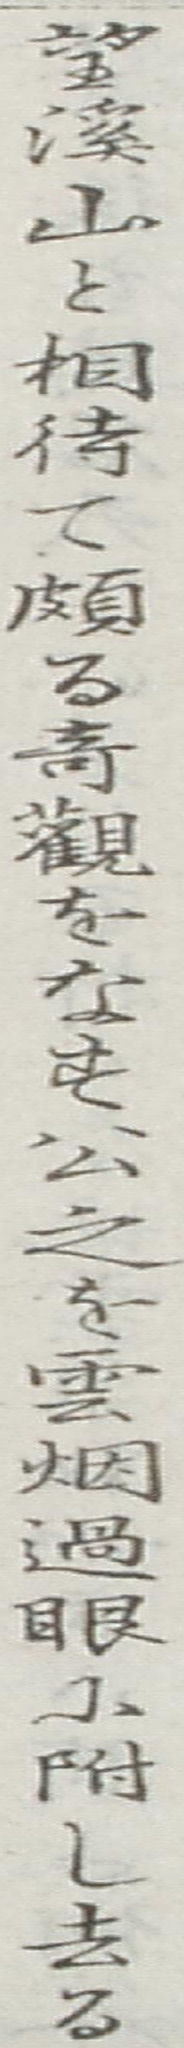望渓山と相待て頗る奇観をなす公之を雲煙過眼に附し去る
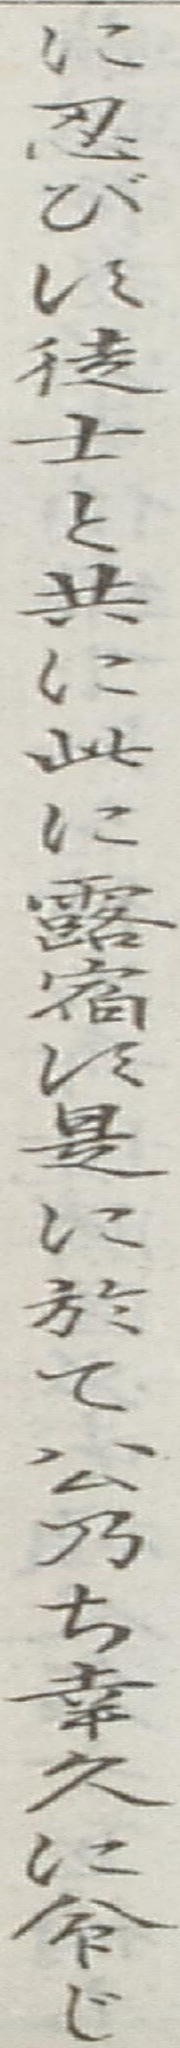に忍びす徒士と共に此に露宿し是に於て公乃ち幸久に命じ
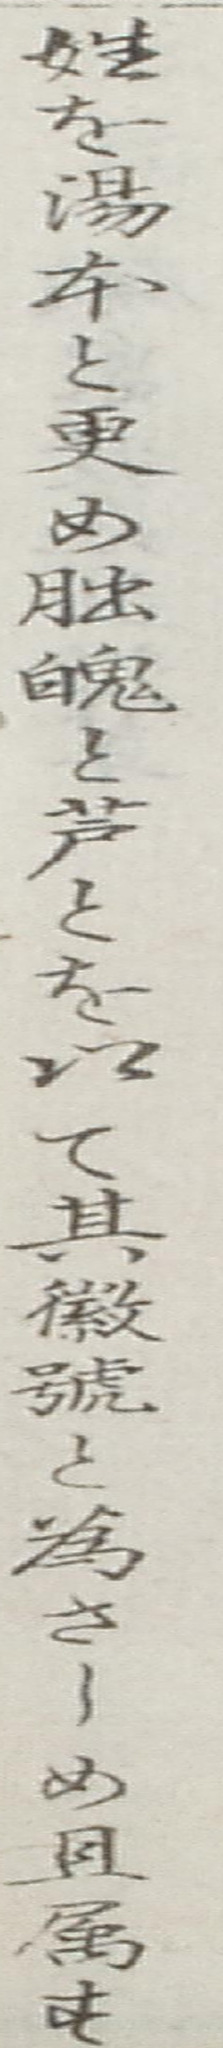姓を湯本と更め朏魄と芦とを以て其徽號と為さしめ且属す
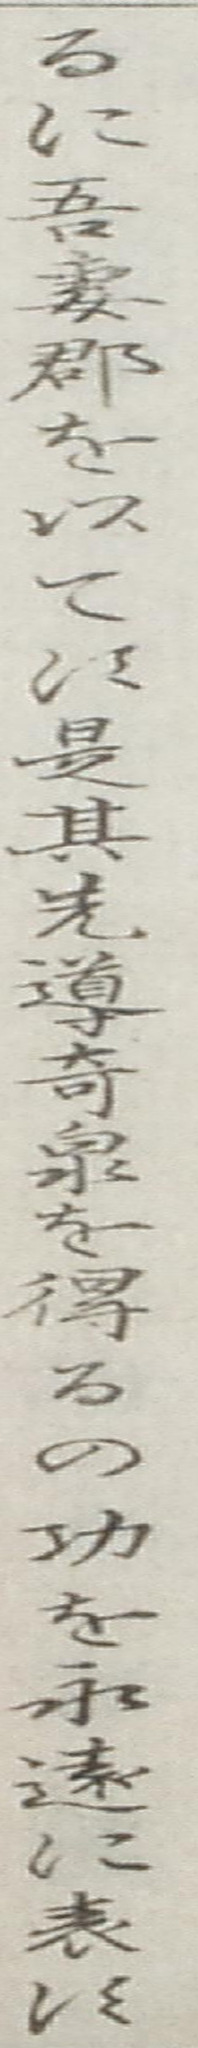るに吾妻郡を以てす是其先導奇泉を得るの功を永遠に表し
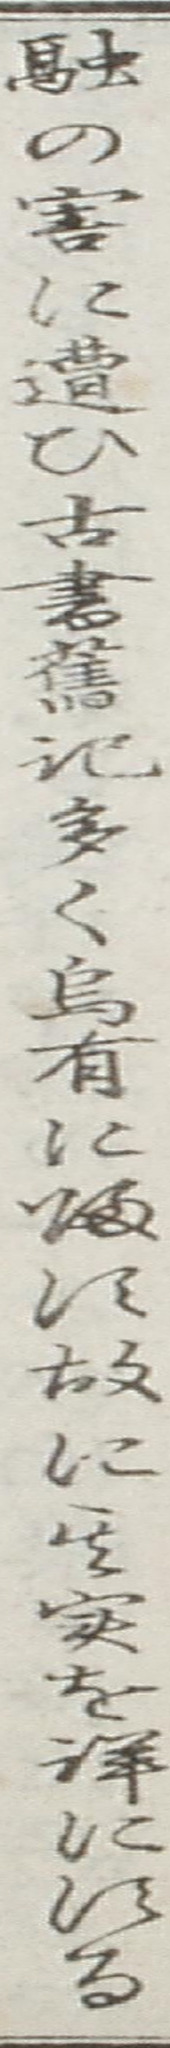融の害に遭ひ古書旧記多く烏有に帰す故に其実を詳にする
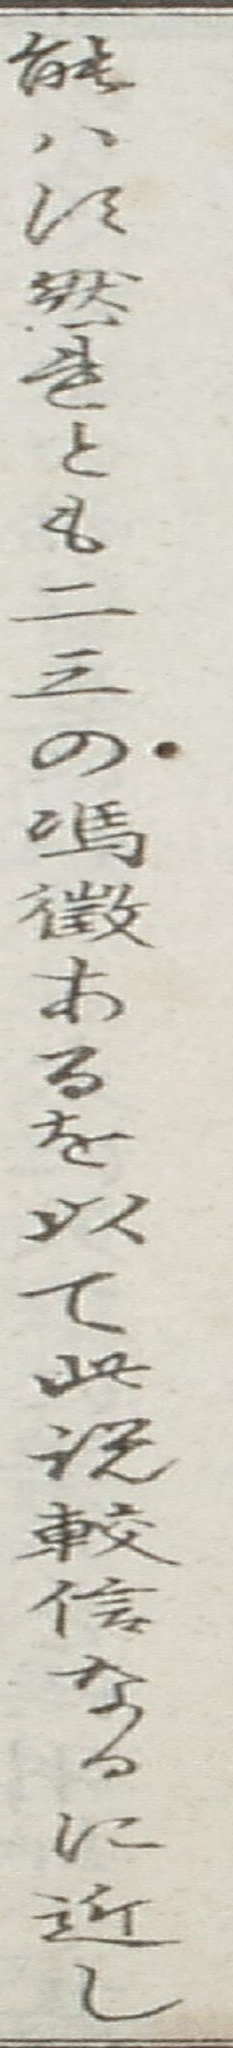能はす然れとも二三の馮徴あるを以て此説較信なるに近し
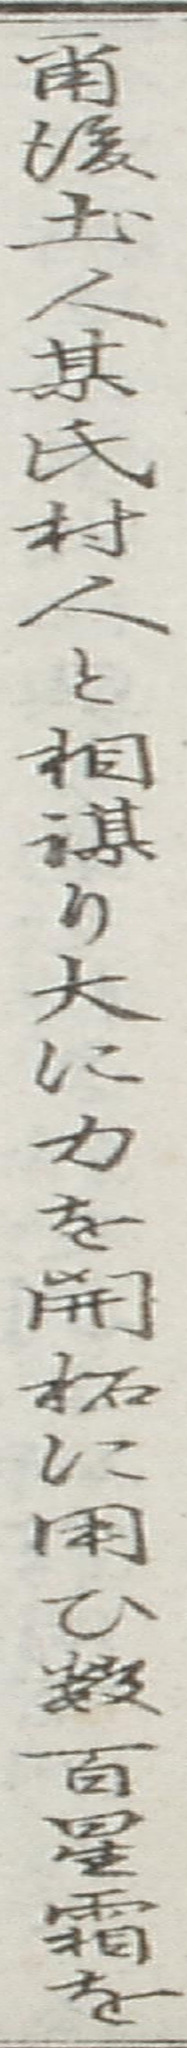爾後土人某氏村人と相謀り大に力を開拓に用ひ数百星霜を
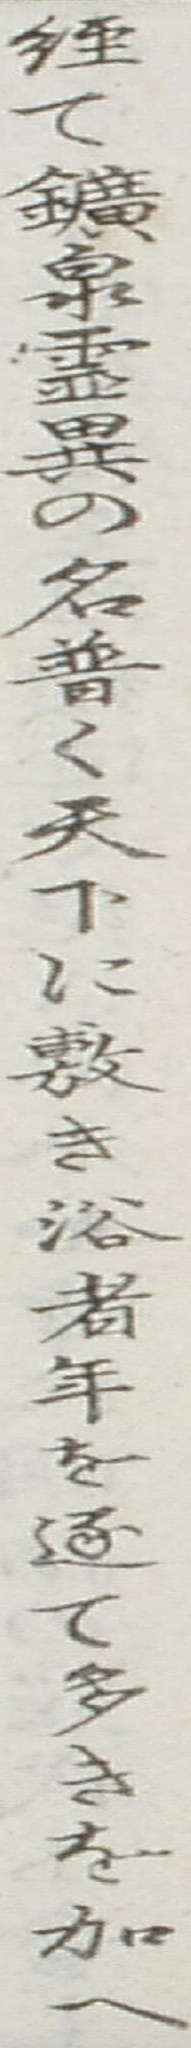経て鉱泉霊異の名普く天下に敷き浴者年を逐て多きを加へ
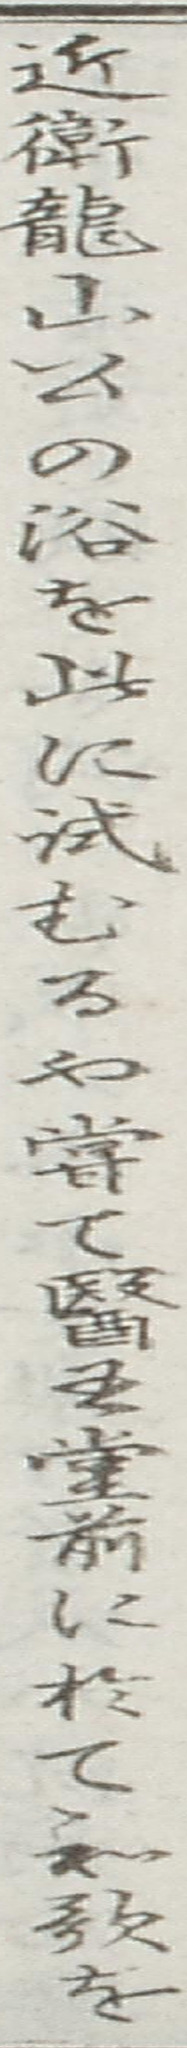近衛龍山公の浴を此に試むるや嘗て医王堂前に於て和歌を
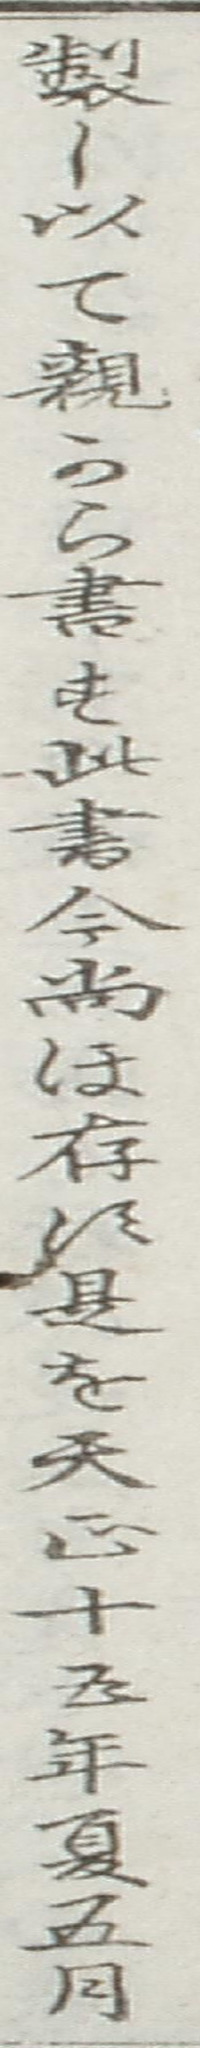製し以て親から書も此書今尚ほ存す是を天正十五年夏五月
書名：草津温泉誌　全
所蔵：東京大学地震研究所図書室 Earthquake Research Institute Library, The University of Tokyo, JAPAN
